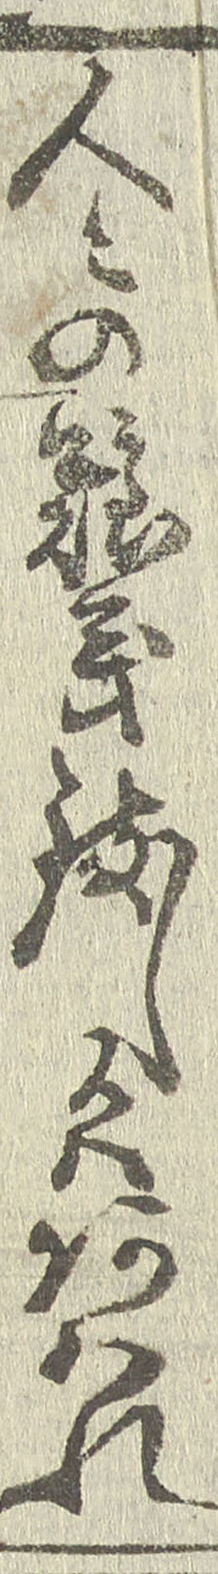人々の難義致し候はあわれ
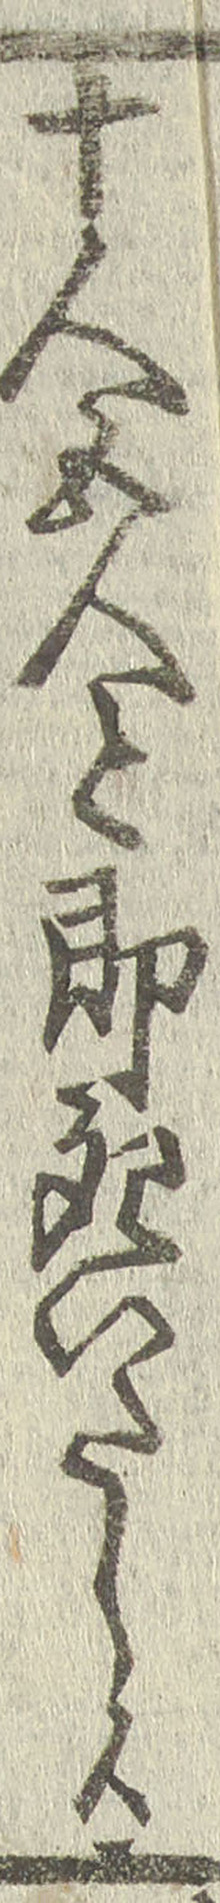十人五人と即死いたし候
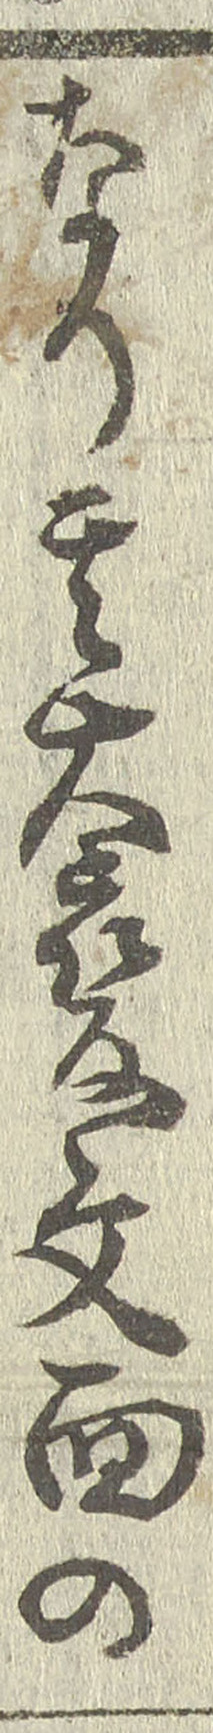なり其大変文面の
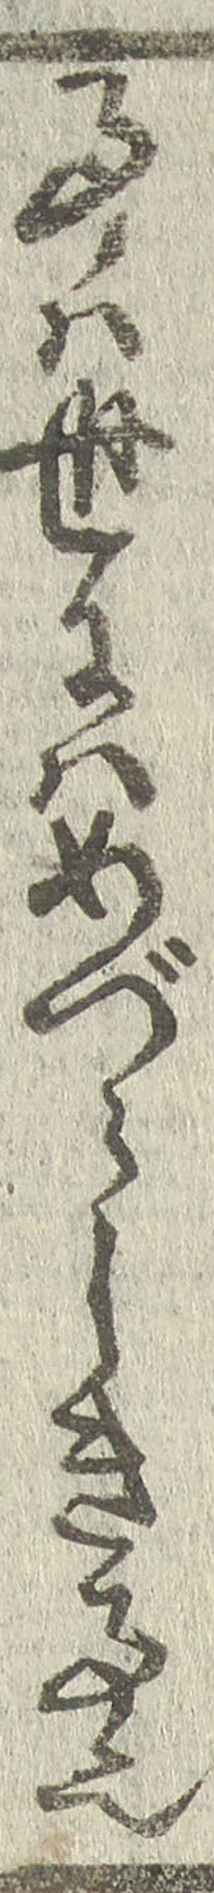事は世にはめづらしき事也
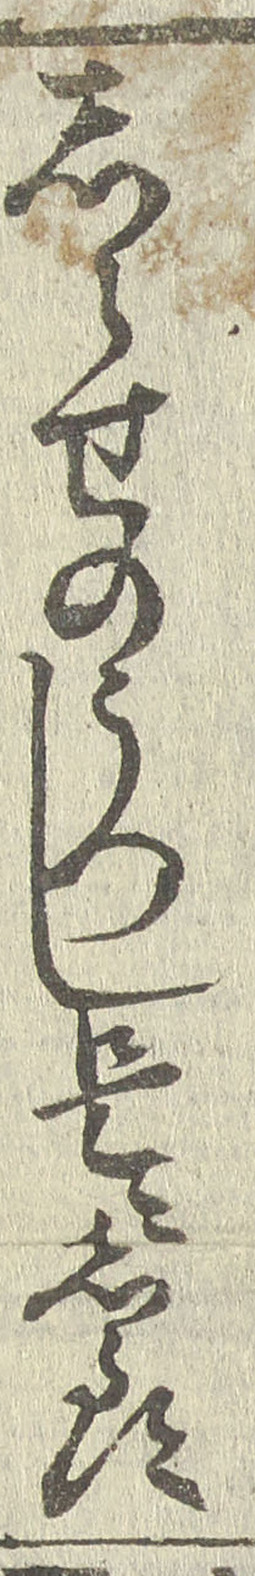しらせのうつし是にしるす
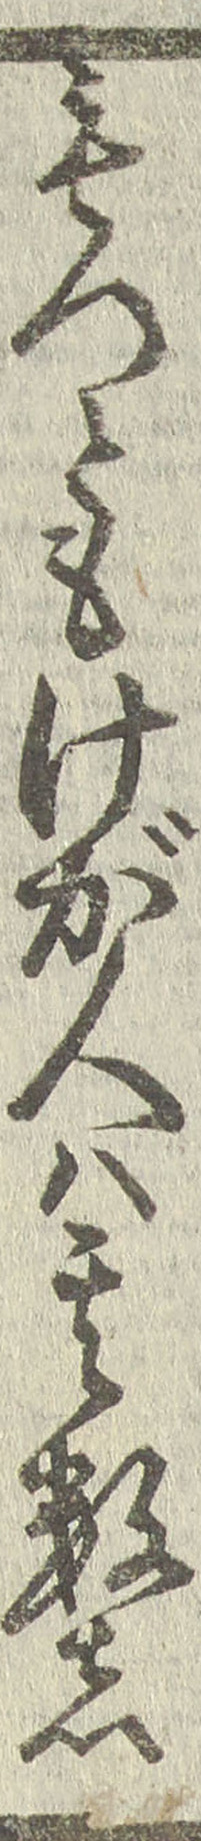もつともけが人は其数し
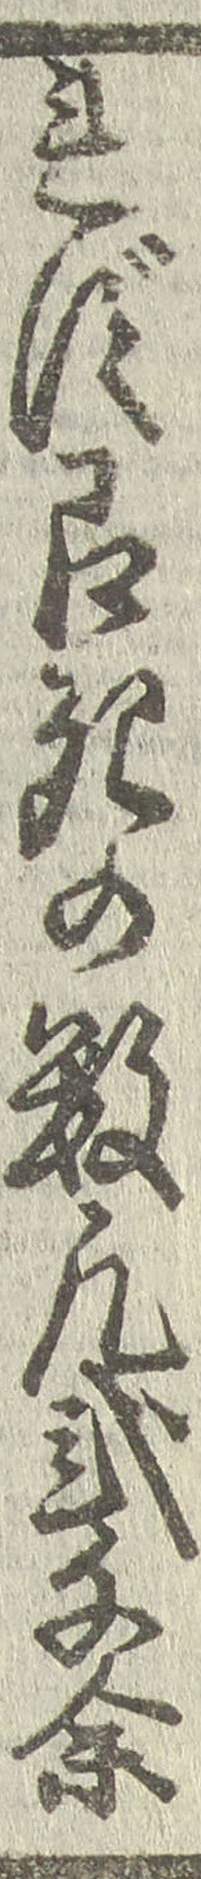れず即死の数凡弐千余
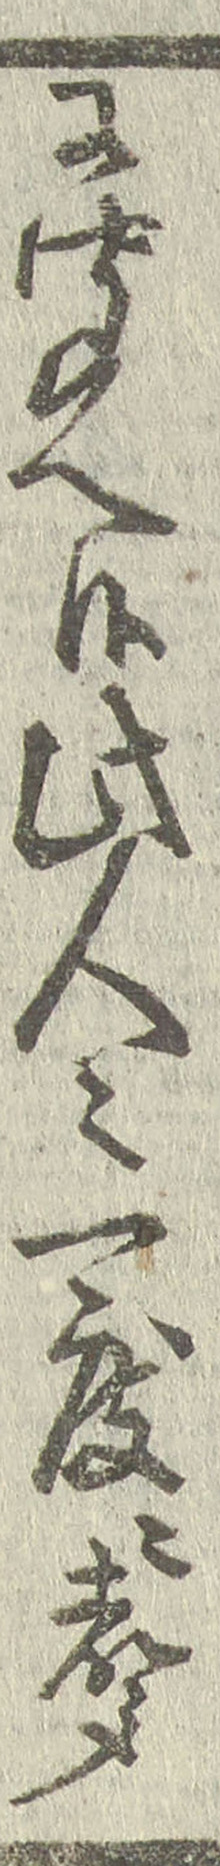に聞へ候此人々一度に声
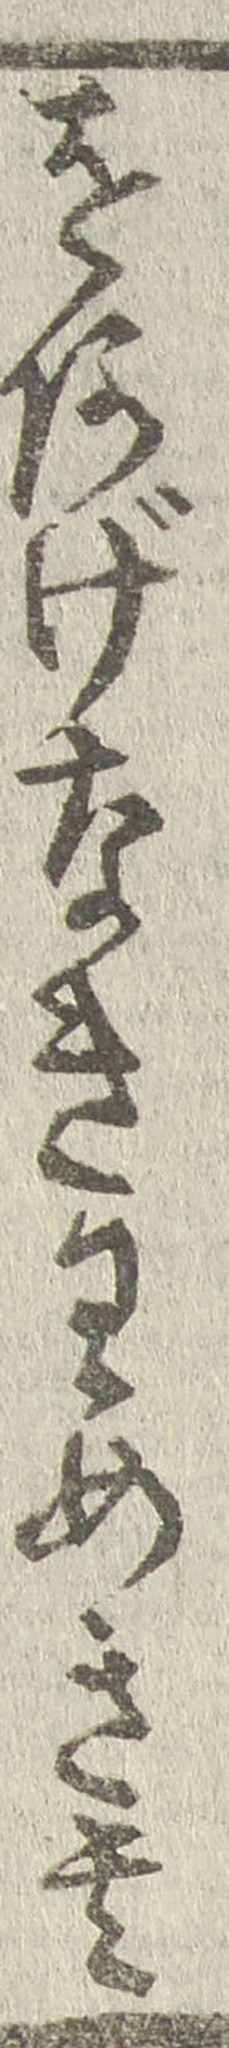をあげなきわめき其
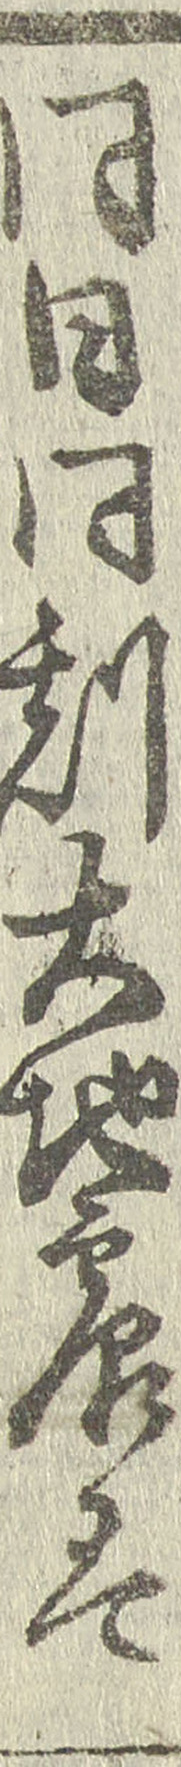同日同刻大地震にて
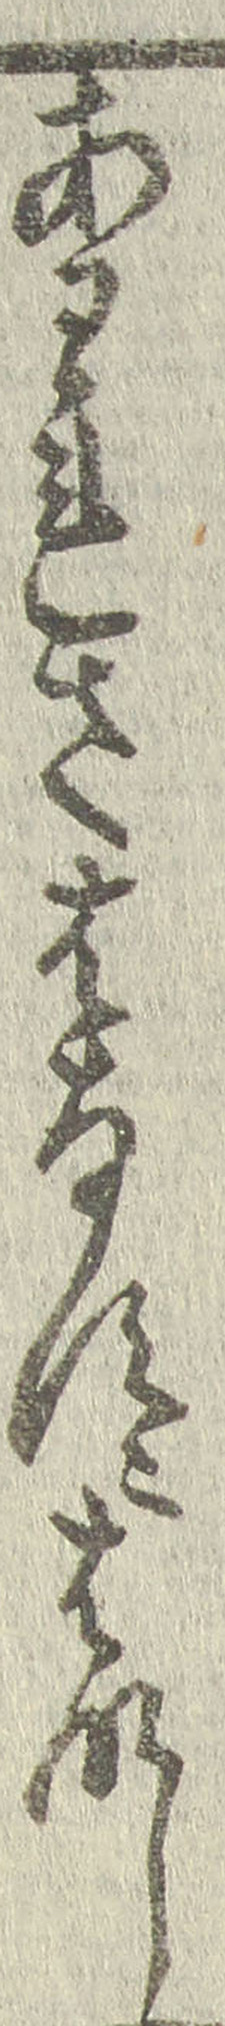あわれさはなすにはなし
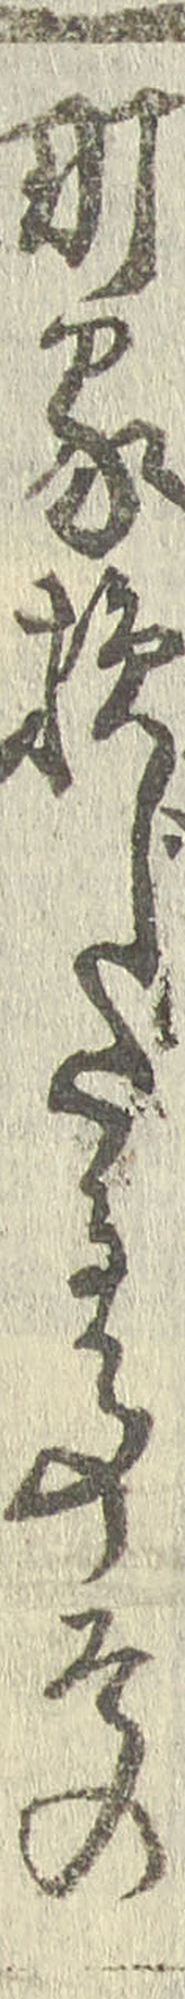町家損じたる事その
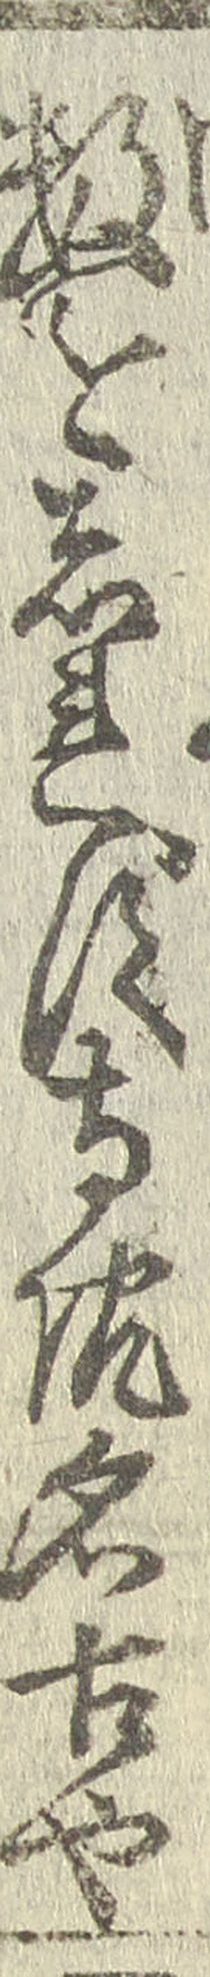数をしれず寺院名古や
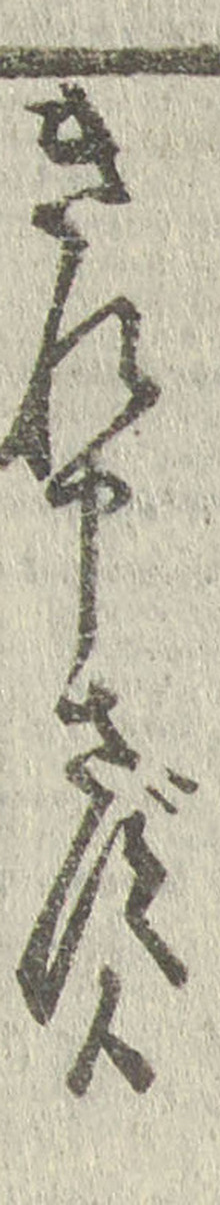きれ申さず候
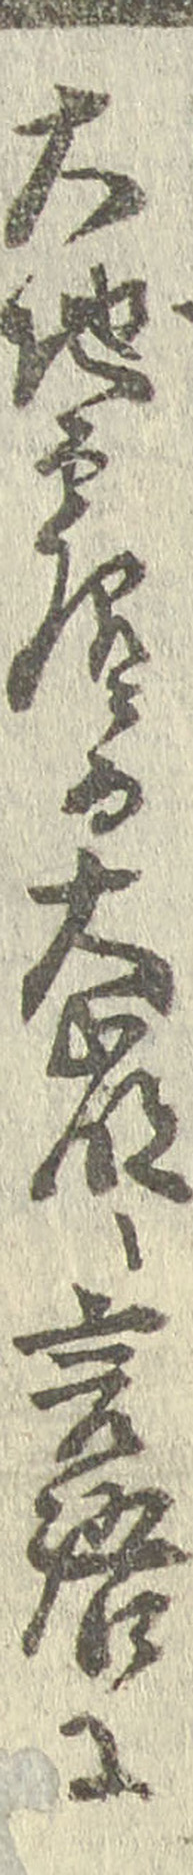大地震にて大崩れ言語に
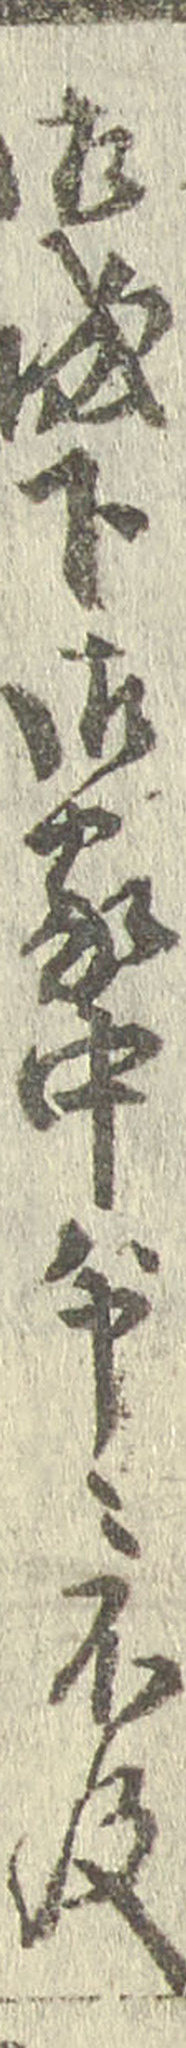御城下御家中は申に不及
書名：諸国大地震大津波 三編
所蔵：東京大学総合図書館 General Library in the University of Tokyo, JAPAN
